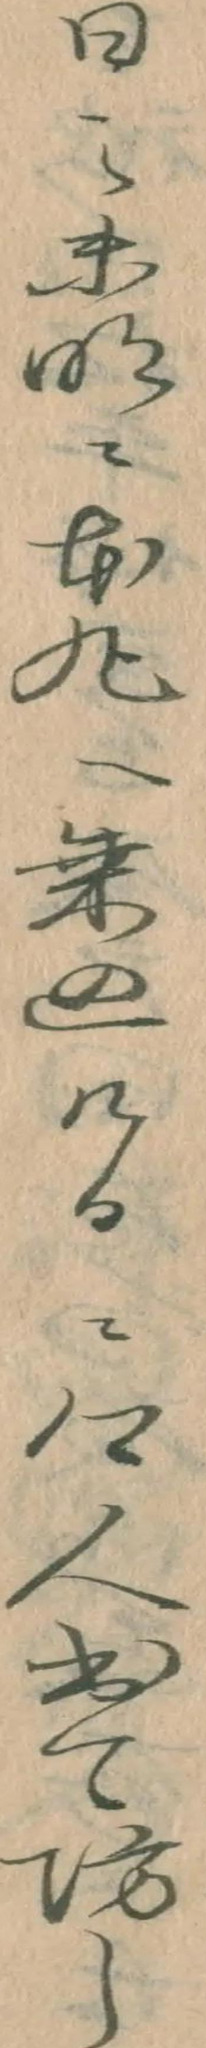日之未明に本丸へ乗込けるに郷人出て防し
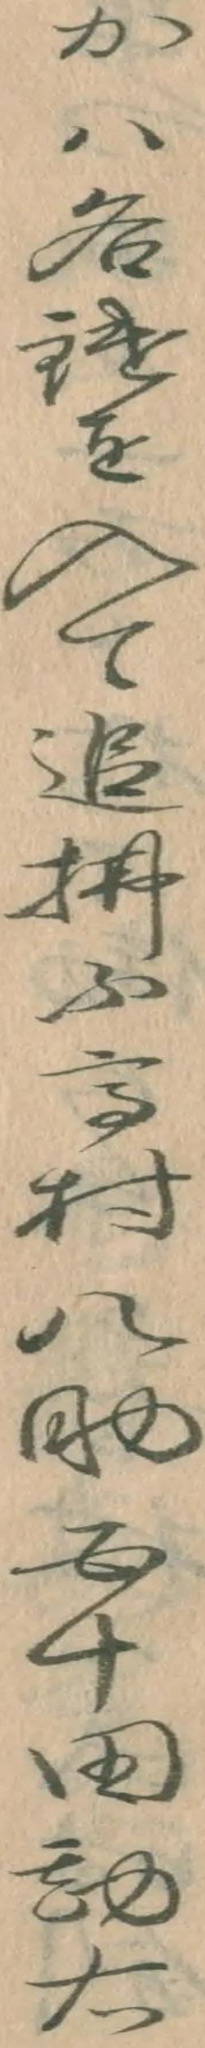かは各鑓を入て追払ふ高村八助五十田勘右

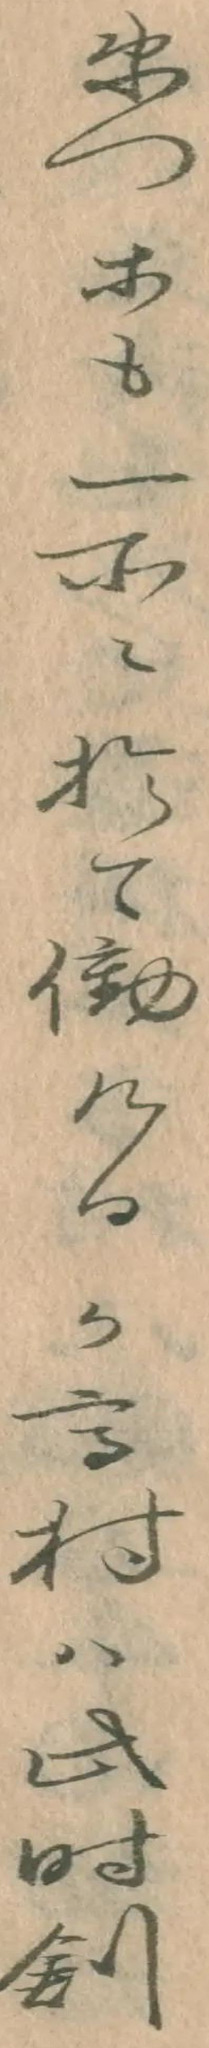衛門等も一所に於て働けるか高村は此時創
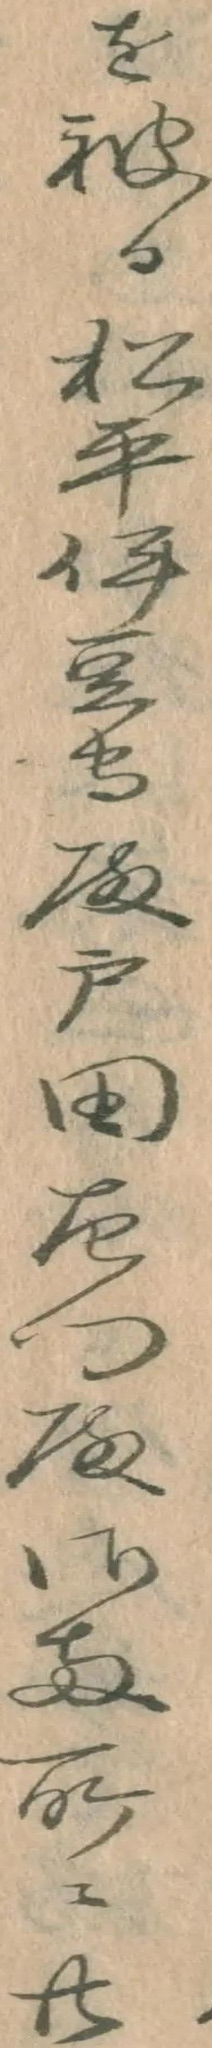を被る松平伊豆守殿戸田左門殿御両所に廿
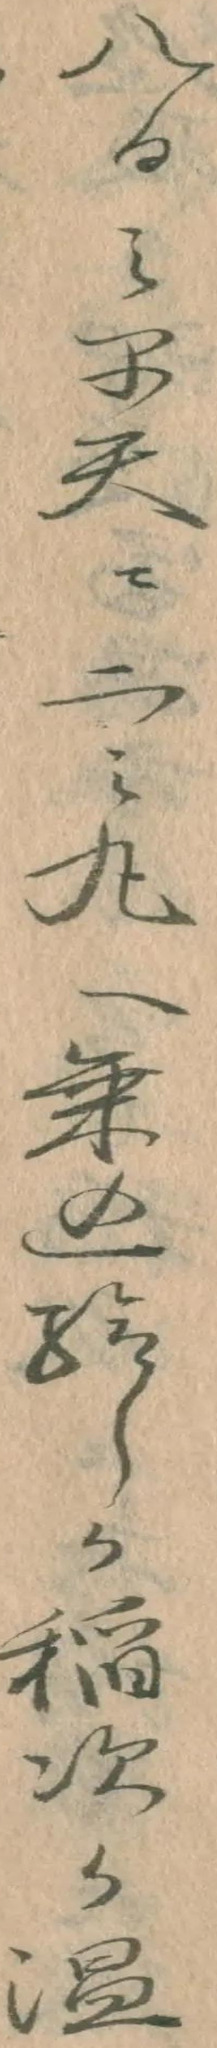八日之早天に二之丸へ乗込給しか稲次か温
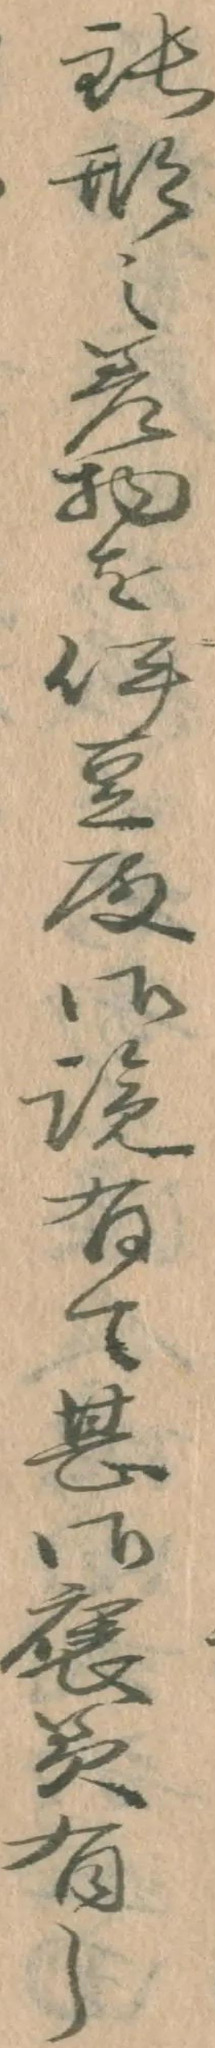飩形之差物を伊豆殿御覧有て甚御褒美有し
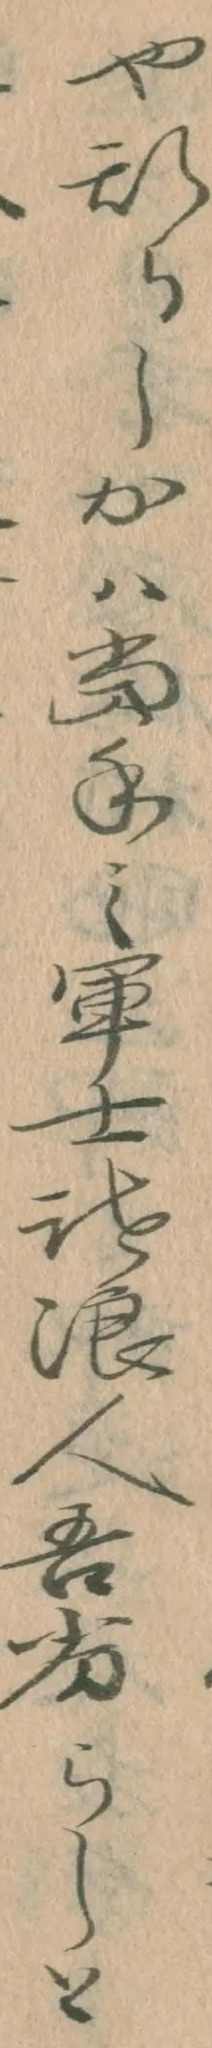也斯りしかは当手之軍士諸浪人吾劣らしと
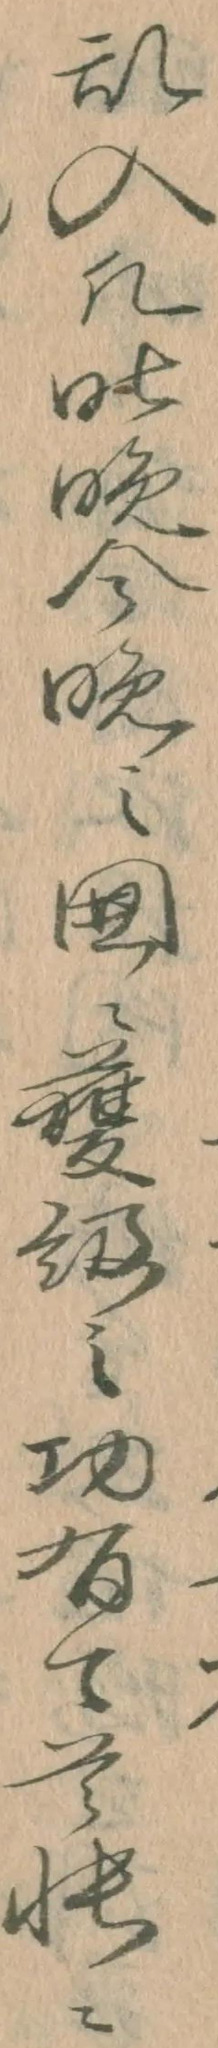乱入凡昨晩今晩之囲に獲級之功有て首張に
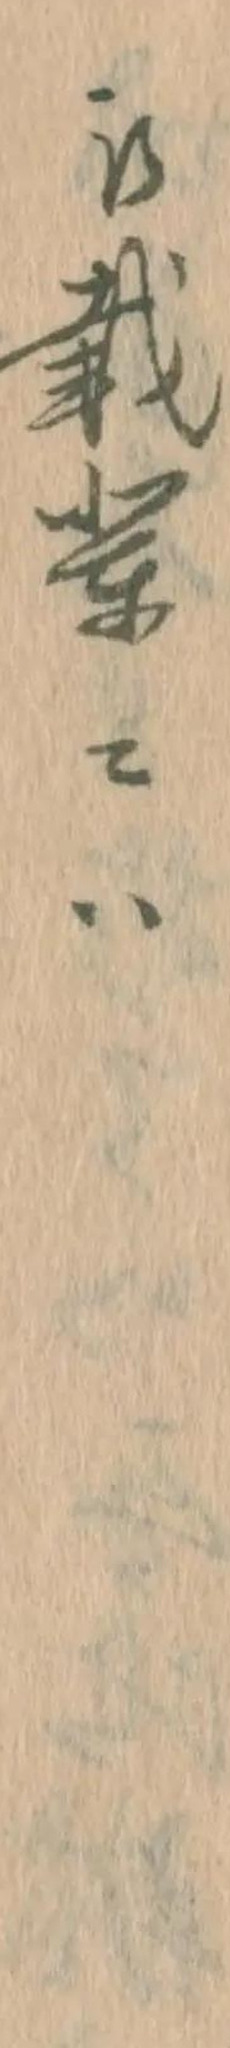被載輩には
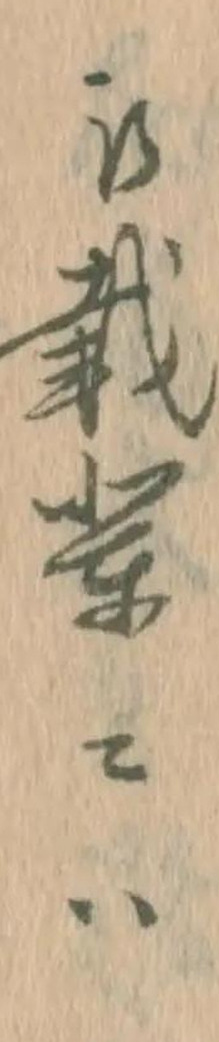被載輩には
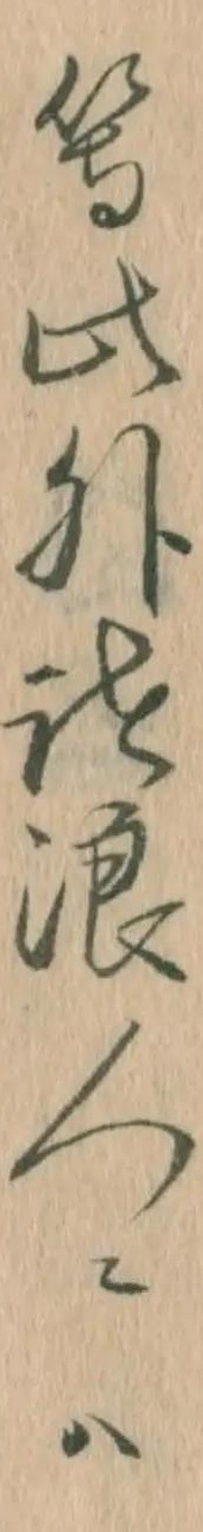等此外諸浪人には

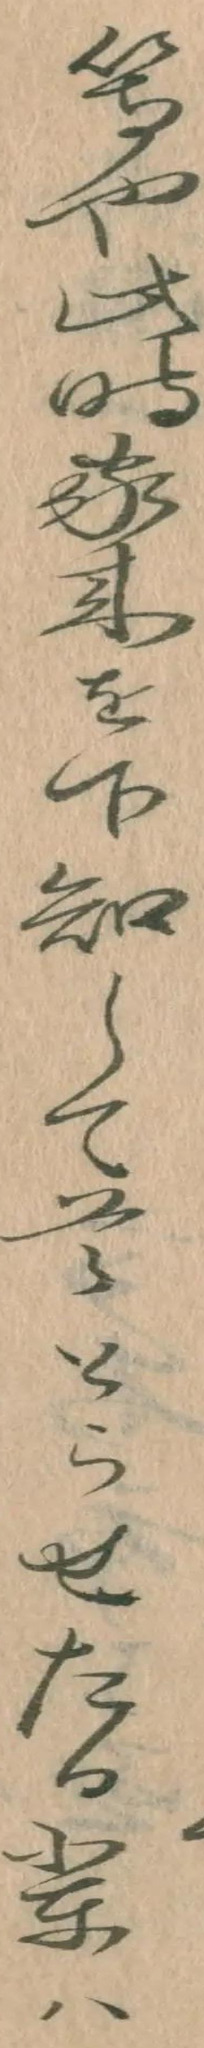等也此時家来を下知して首とらせたる輩は
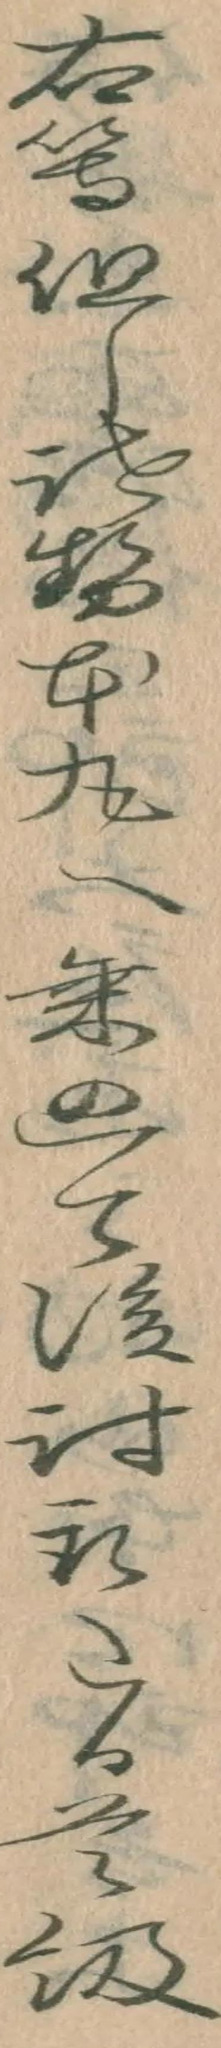右等組し諸勢本丸へ乗込て後討取たる首級
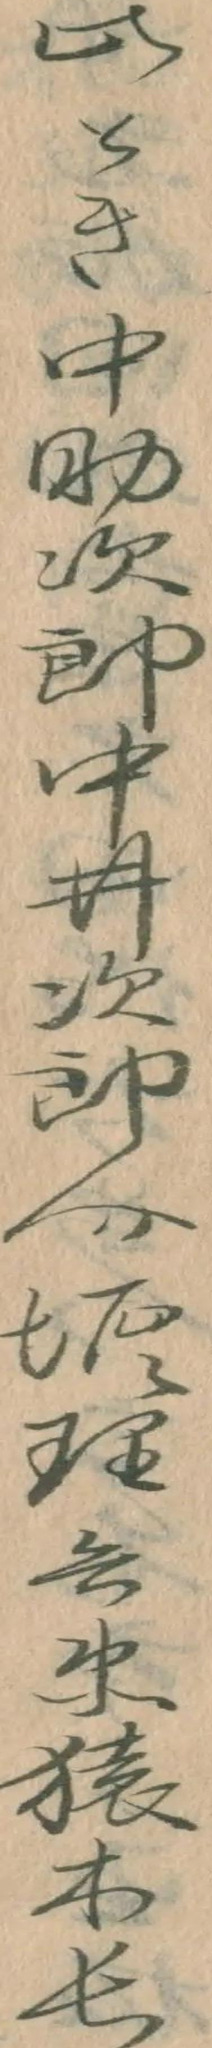此とき中助次郎中井次郎介堀理兵衛猿木長
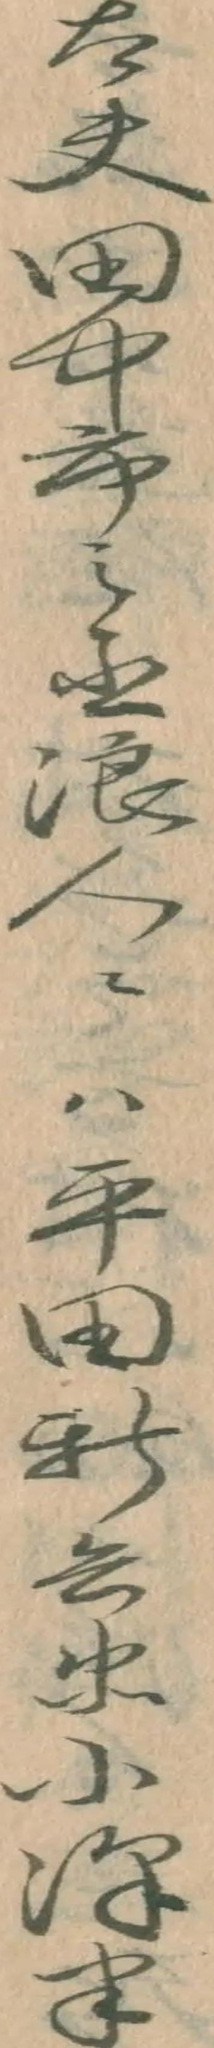太夫田中市之丞浪人には平田新兵衛小沢半

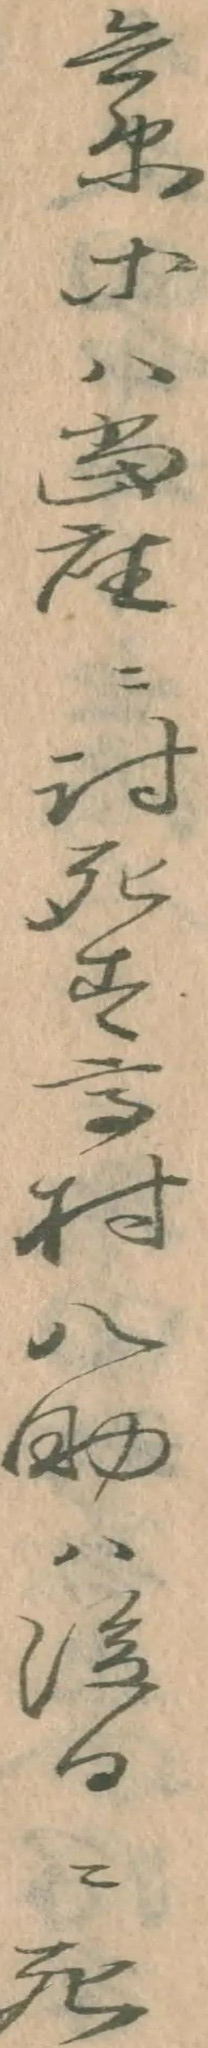兵衛等は当座に討死春高村八助は後日に死
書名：切支丹御退治記 49巻. [9]
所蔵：国立国会図書館 National Diet Library, JAPAN
